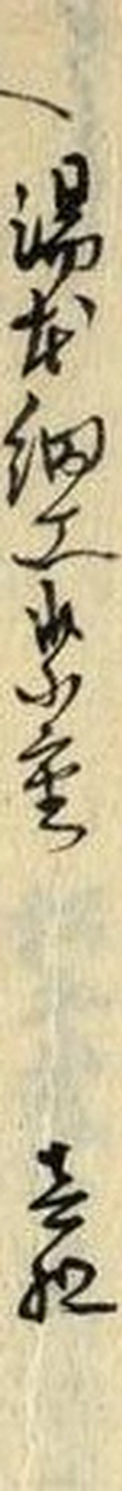湯本細工御小重壱組
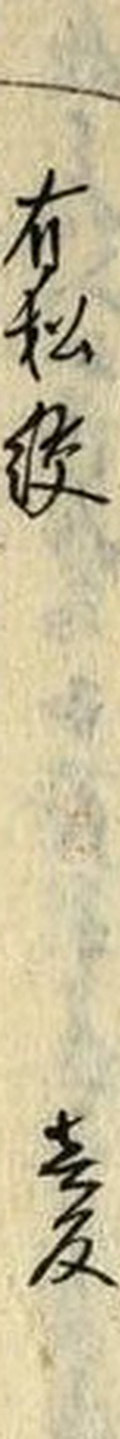有松絞壱反
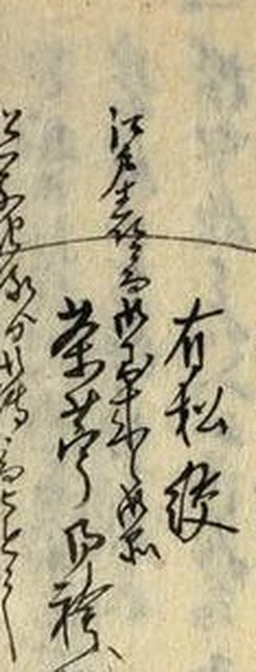江戸表ニ而御到来之御品
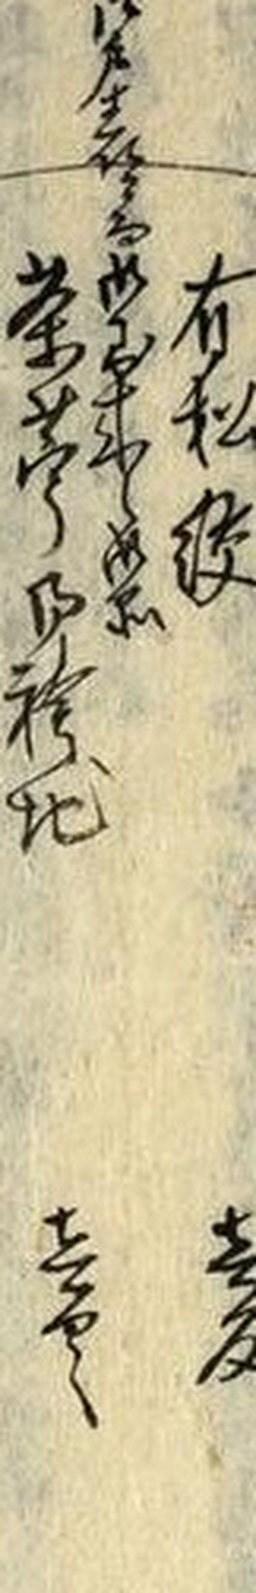茶苧御袴地壱具
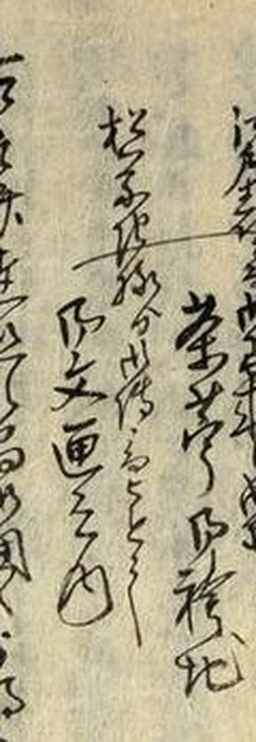松栄院様ゟ御伝ニ而被進之
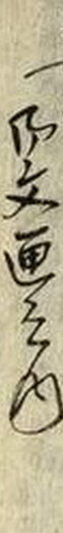御文匣之内
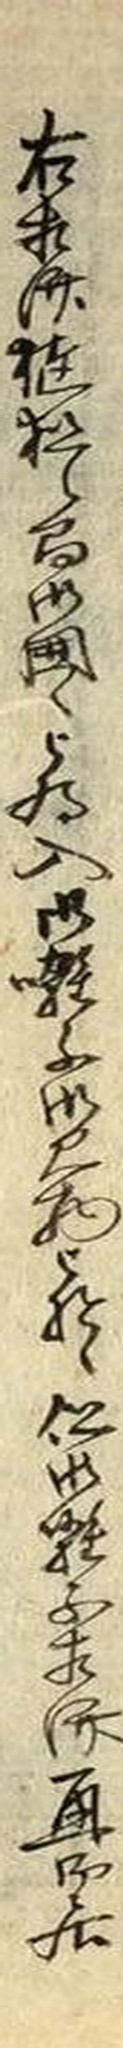右相済韃靼之間御囲へ被為入御囃子御見物被遊候但御囃子相済再御居
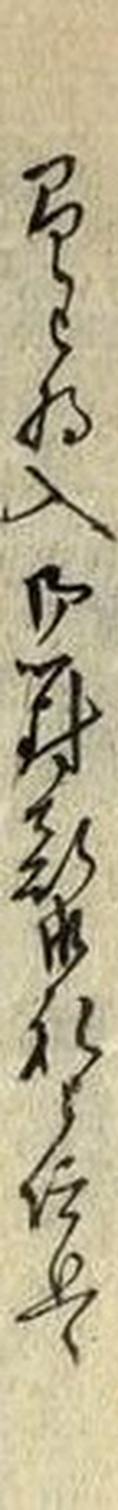間へ被為入御対顔御礼被仰上候
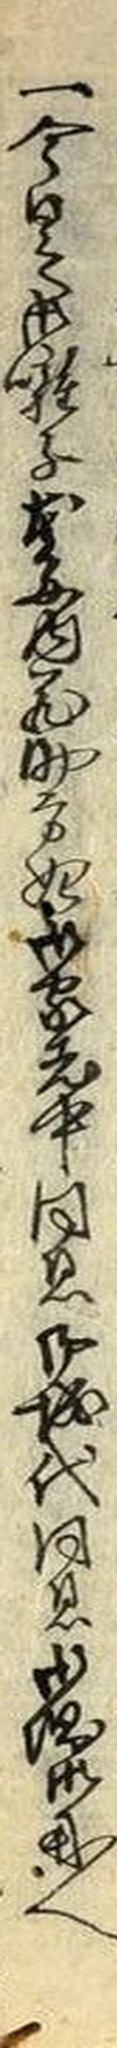一今日之御囃子本多内蔵助方始御家老中同息御城代同息御側御用人
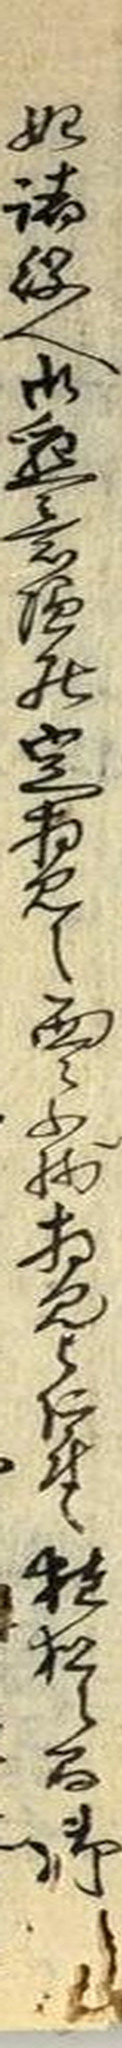始諸役人御懇意隠居定拝見之面々不残拝見被仰付候韃靼之間御
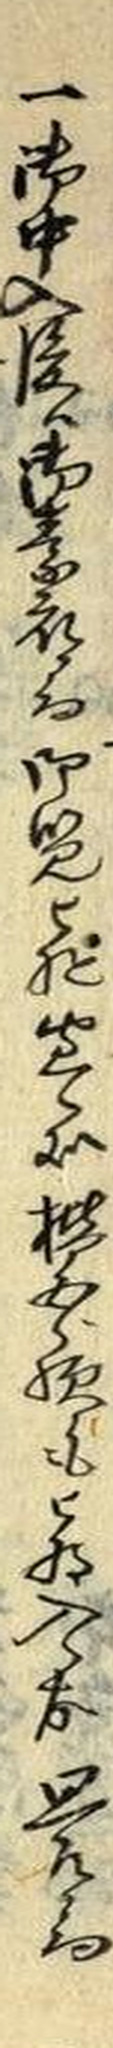一御中入後ハ御素衣ニ而御覧被遊宜候処楷五郎様ニも被為入候故思召ニ而
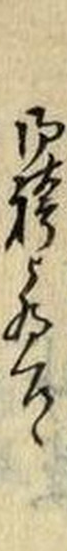御袴為召候
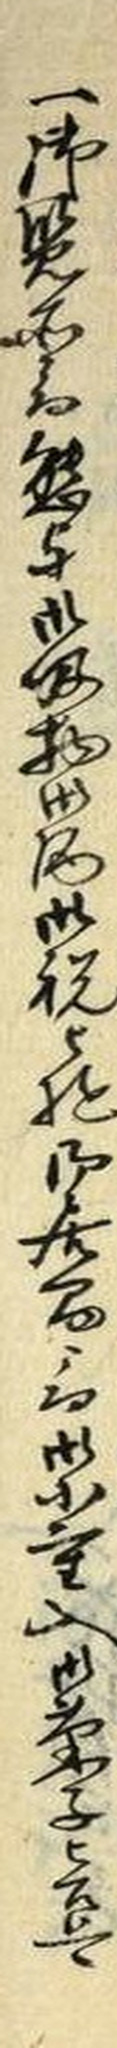一御覧所ニ而態与御吸物御酒御祝被遊御居間ニ而御小重入御菓子被召上候
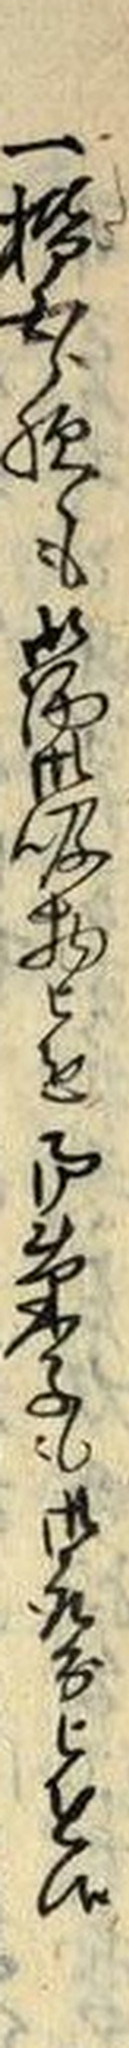一楷五郎様へも御酒御吸物被進御菓子も御取分被進候
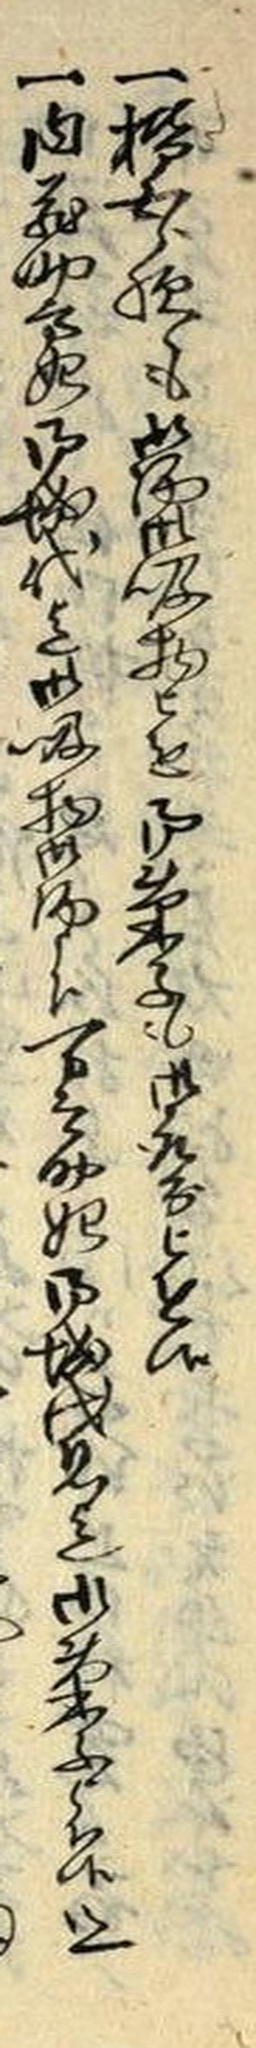一内蔵助方始御城代迄御吸物御酒被下万之助始御城代息迄御菓子被下候且
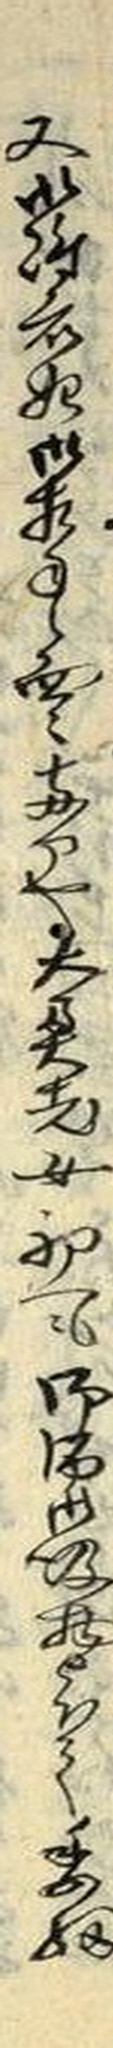又御附衆始御相手之面々両部や大奥老女初へも御酒御吸物被下之委細
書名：少傅日録抄（斉善付側向頭取日記、江戸并道中、初入在国、逝去後…
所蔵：福井県文書館 Fukui Prefectural Archives
